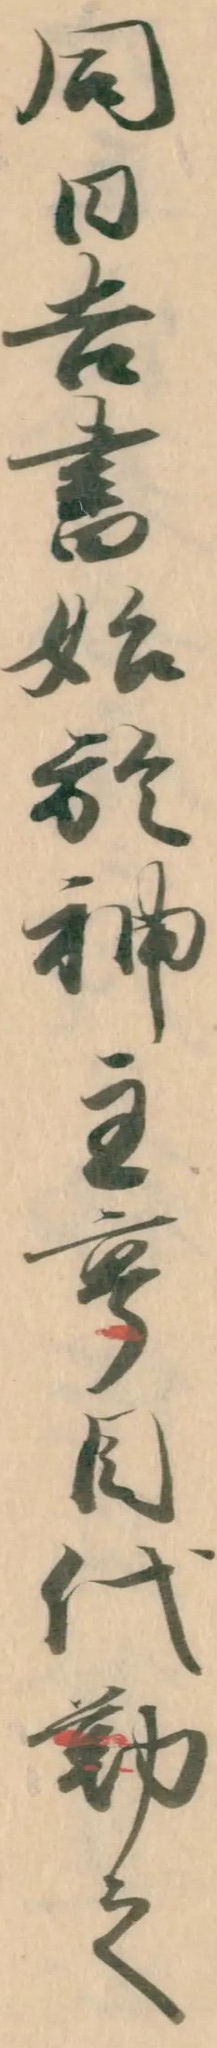同日吉書始於神主亭目代勤之
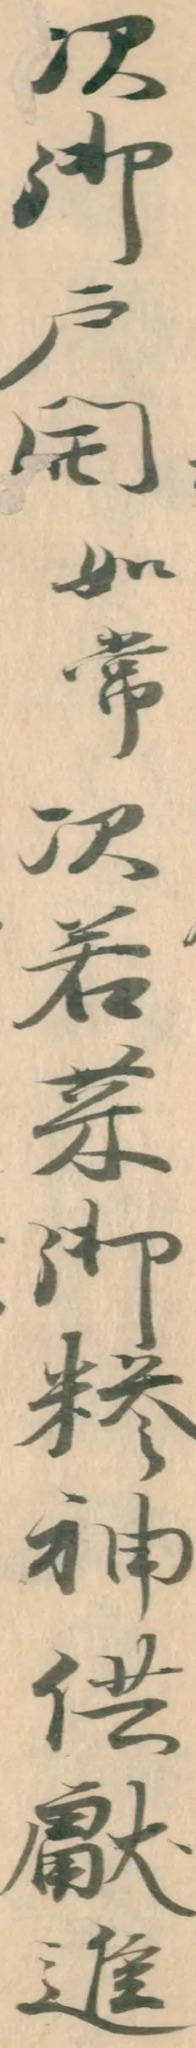次御戸開如常次若菜御糝神供献進
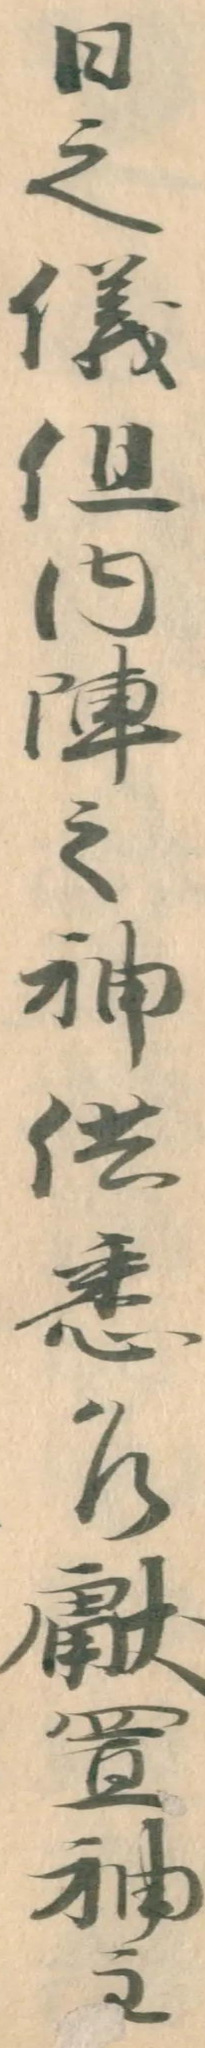日之儀但内陣之神供悉乍献置神主
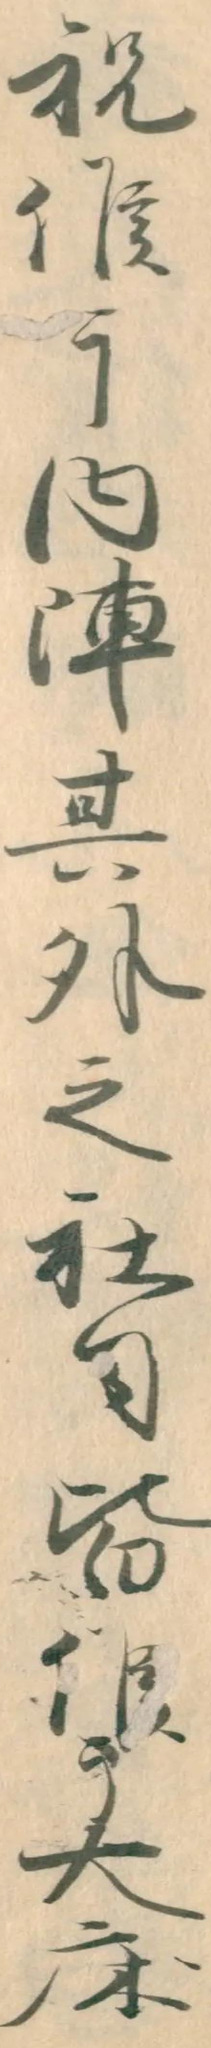祝候干内陣其外之社司皆候于大床
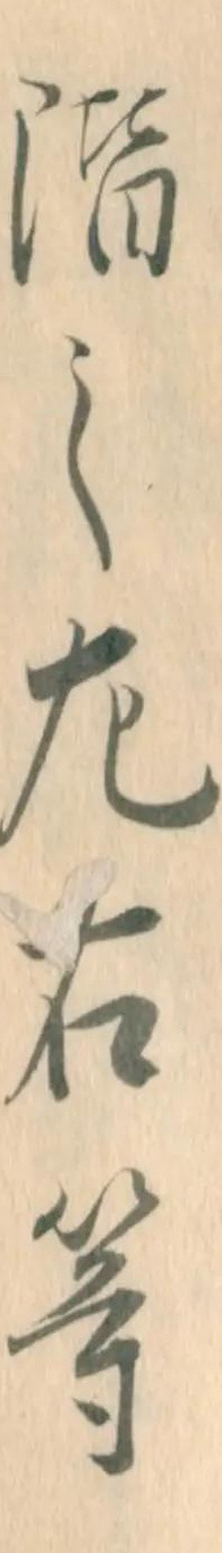階之左右等
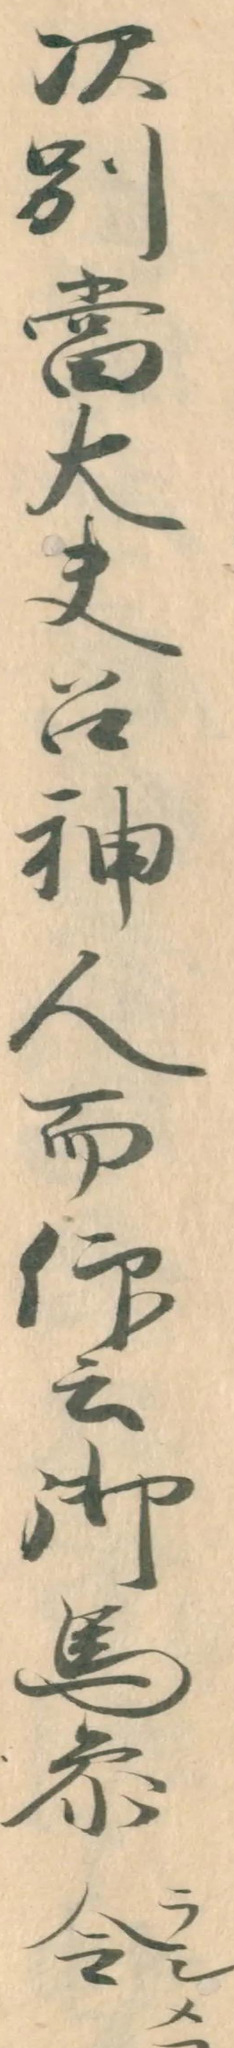次別当大夫召神人而仰云御馬参令
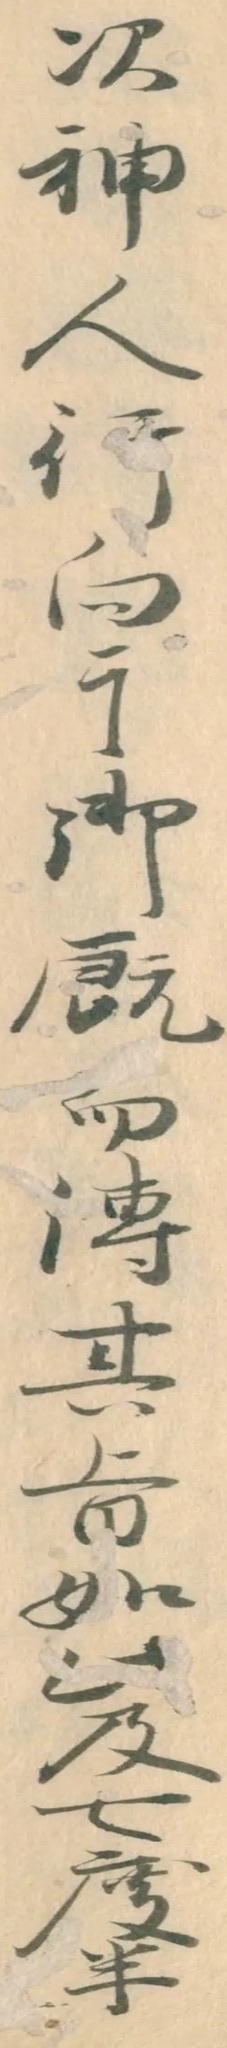次神人行向于御厩而伝其旨如此及七度半

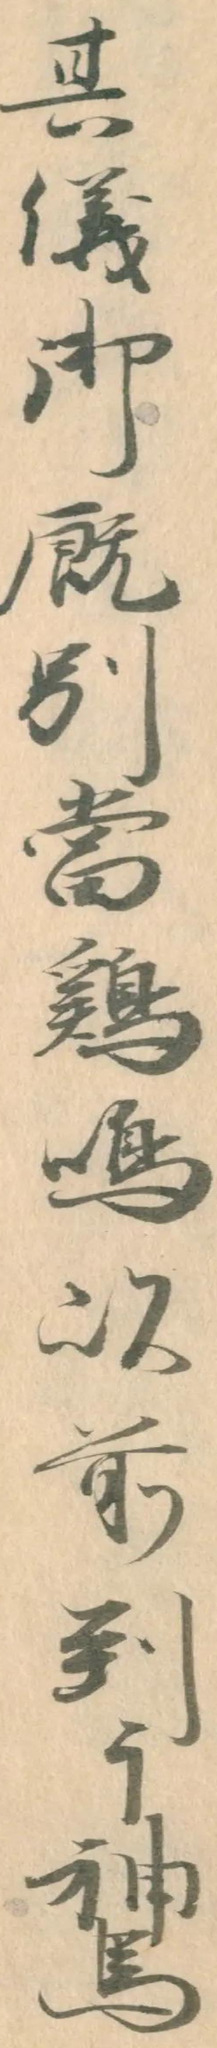其儀御厩別当鶏鳴以前到于神馬
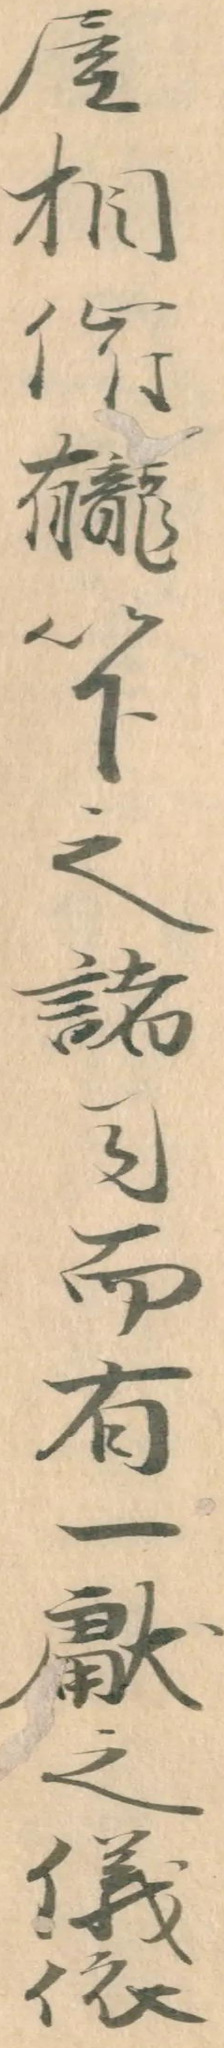屋相催龓以下之諸司而有一献之儀依
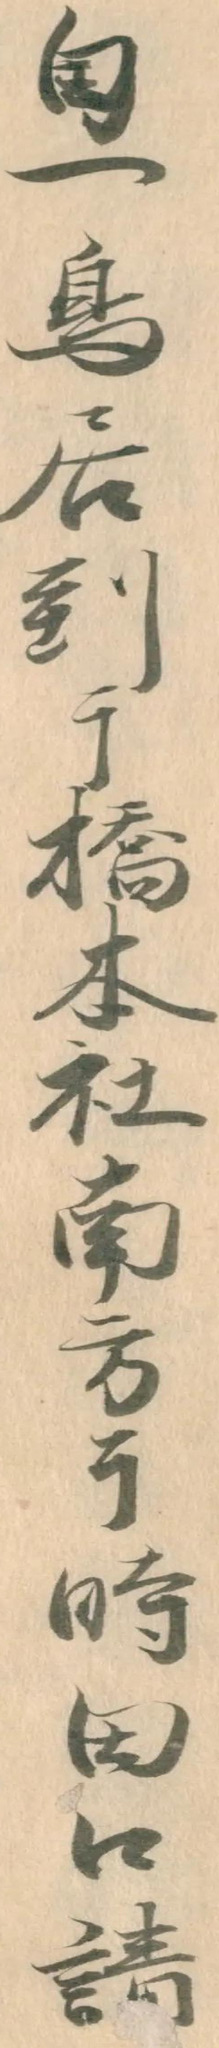自一鳥居到于橋本社南方于時田口請
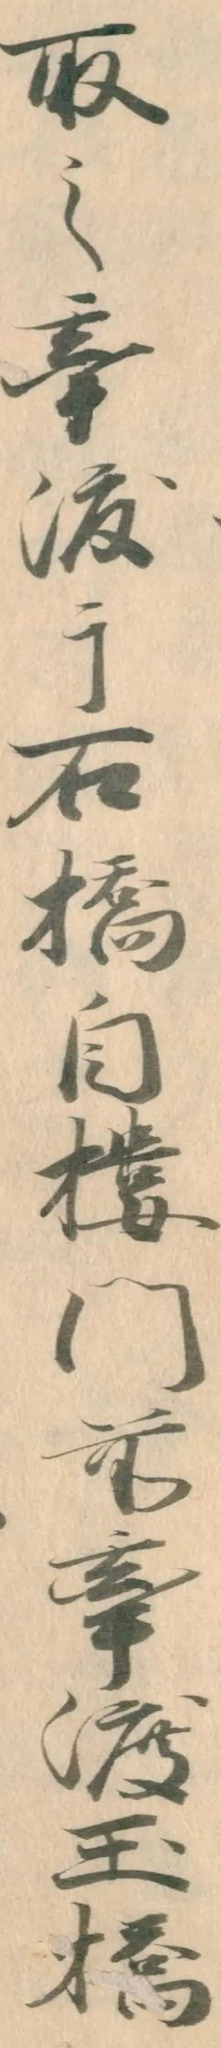取之牽渡于石橋自楼門前牽渡玉橋
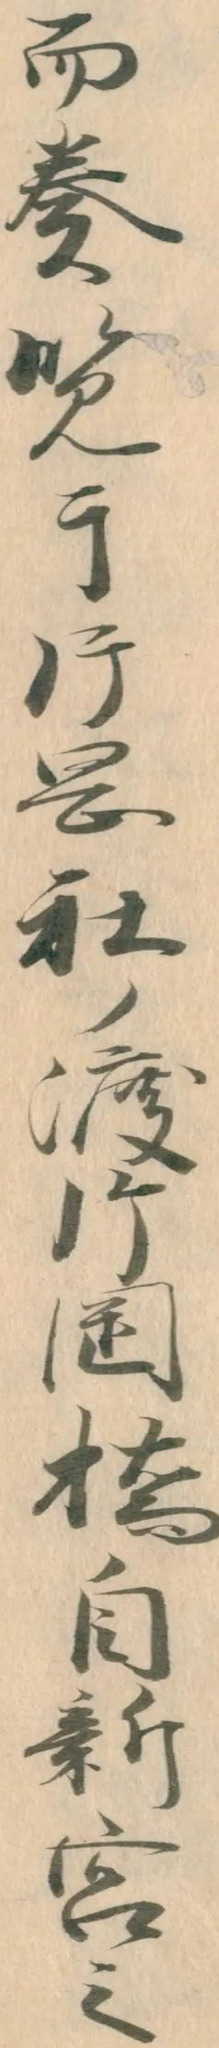而奏覧于片岡社ノ渡片岡橋自新宮之
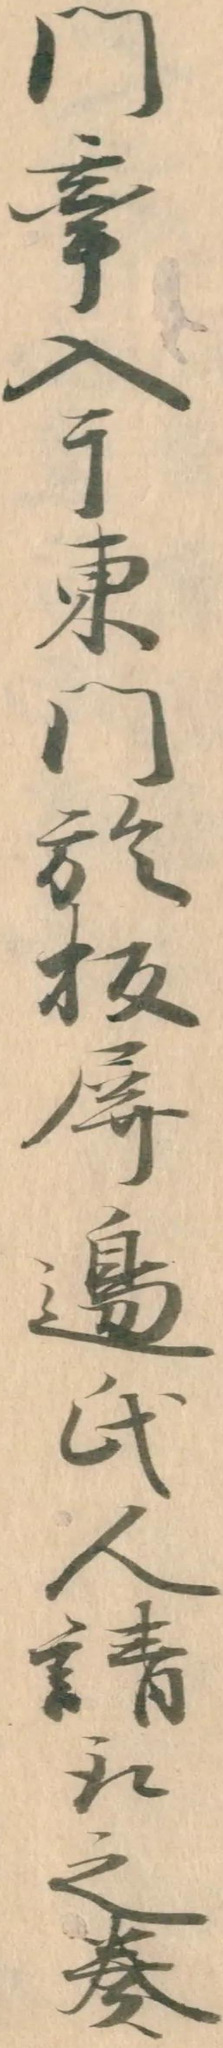門牽入于東門於板屏辺氏人請取之奏
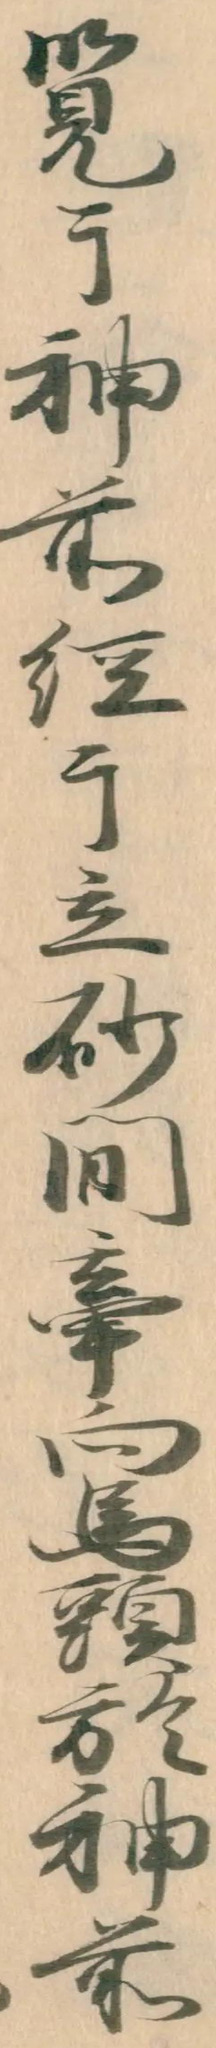覧于神前経于立砂間牽向馬頭於神前
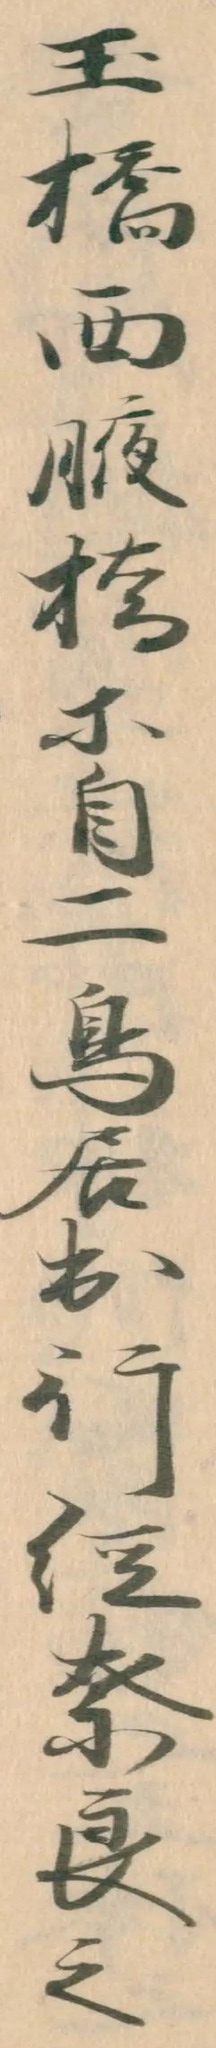玉橋西腋橋等自二鳥居出行経奈良之
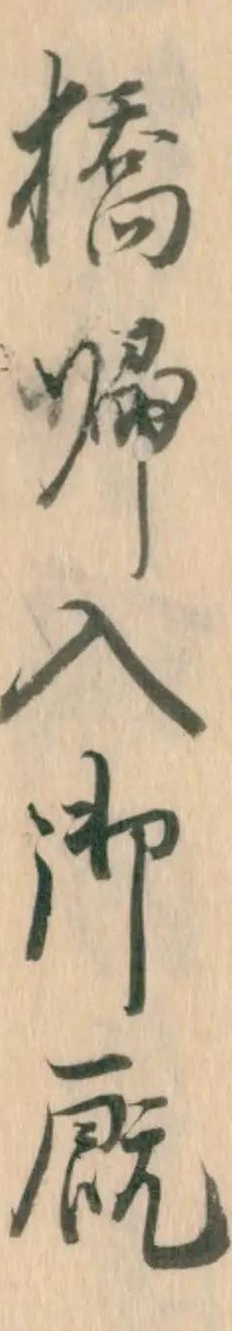橋帰入御厩
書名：賀茂太神宮年中神事略次第
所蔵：国立国会図書館 National Diet Library, JAPAN
